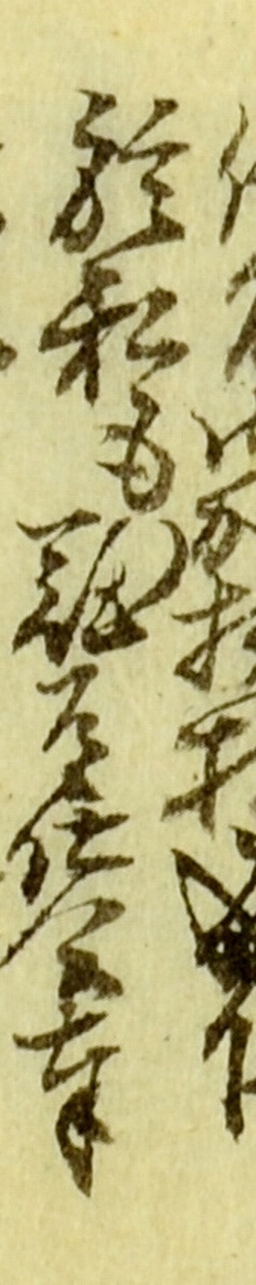於私も難有仕合奉
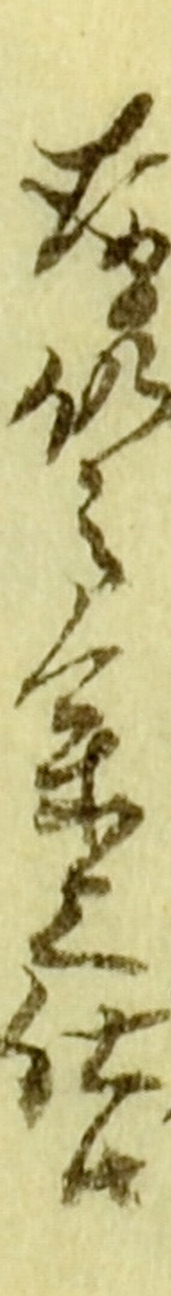存候仍之参上仕候
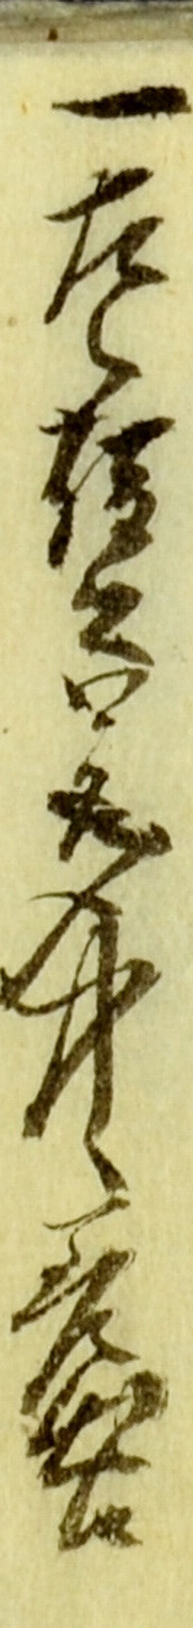一左之端書御取〆中へ差出候
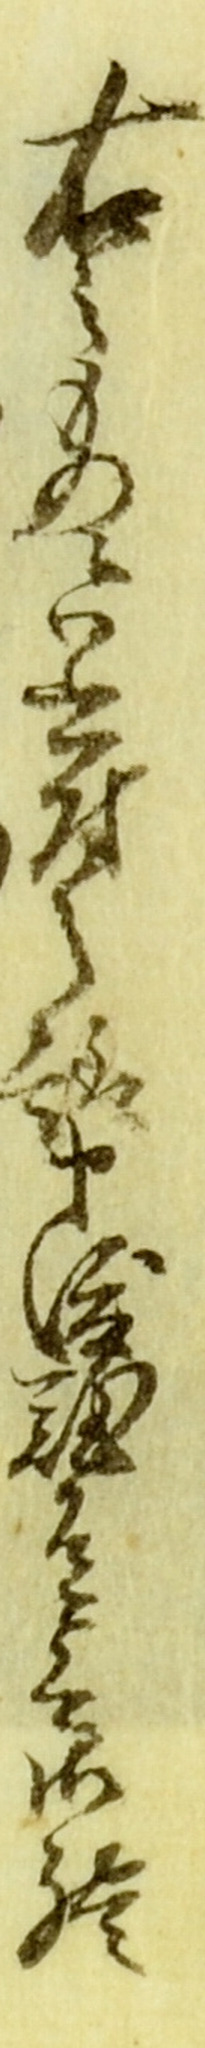右之ものニ御書付之趣申渡難有とて御礼
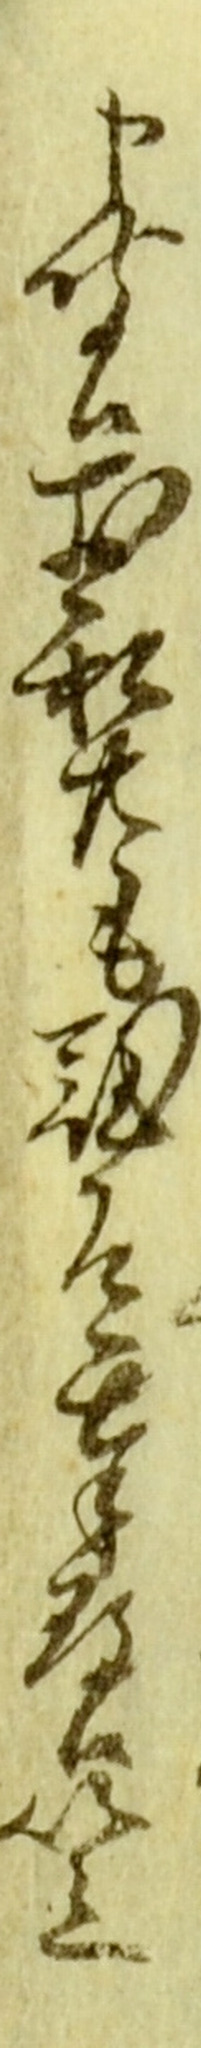申聞候私共も難有奉存候以上

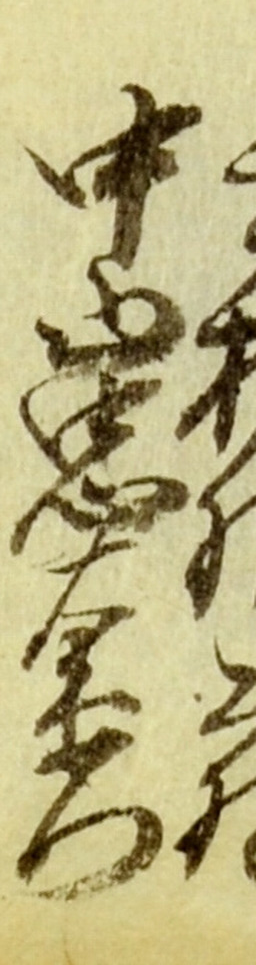中山忠右衛門
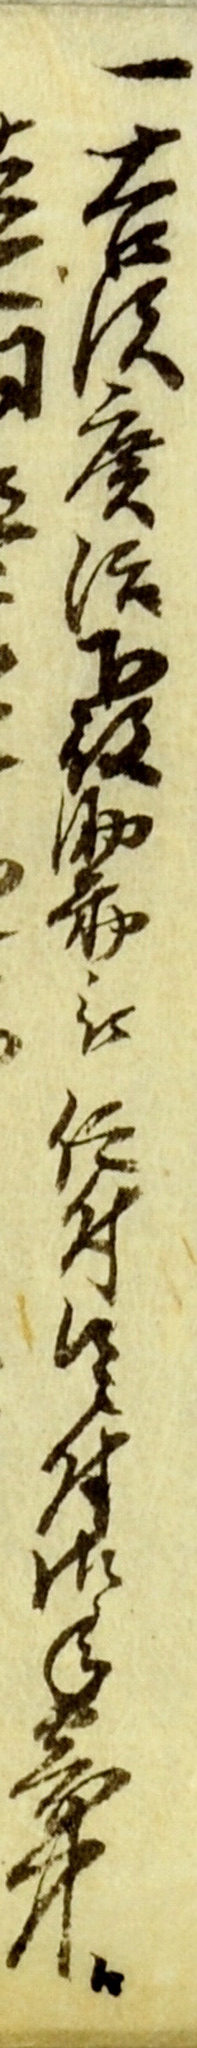一吉沢廣治下役助勤被仰付候ニ付御年寄中江
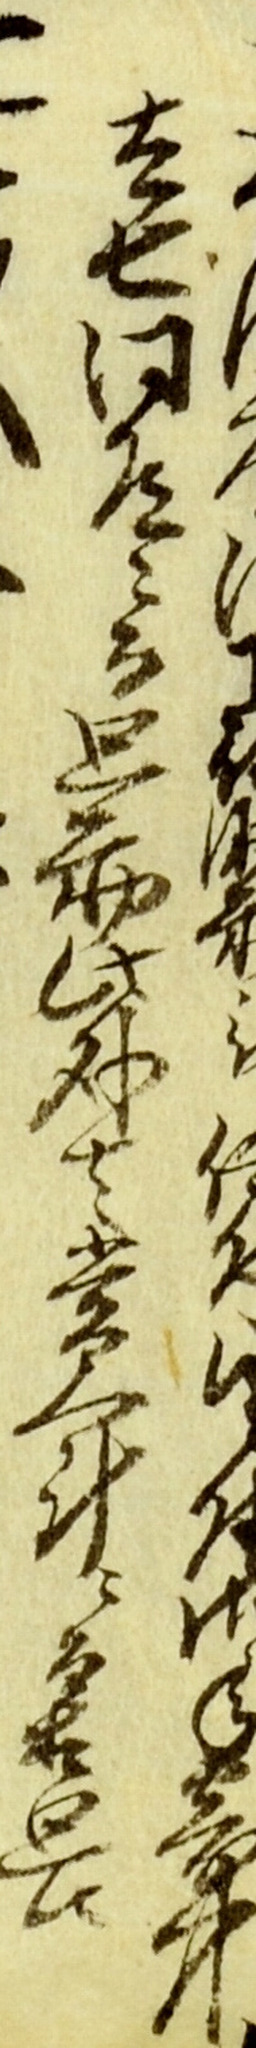太七同道ニ而廻勤此外者当人斗ニ而相廻候
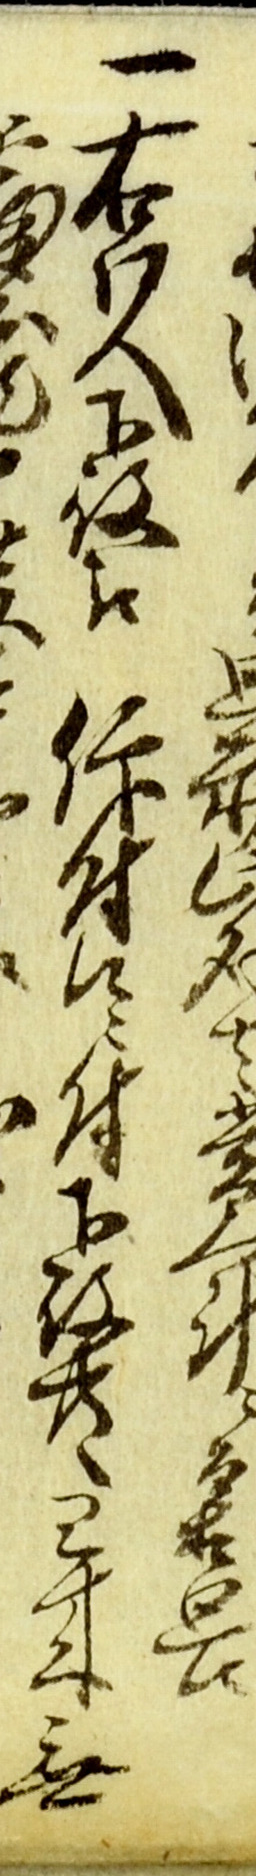一右同人下役被仰付候ニ付下役共へ已来無
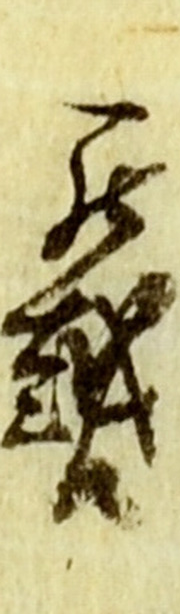罷越候
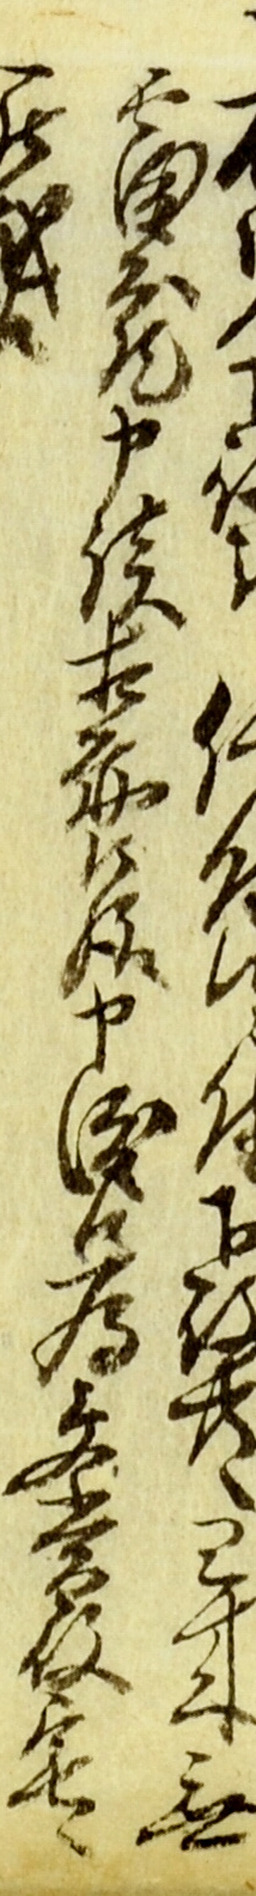覆蔵申談相勤候様申渡候為受当役宅へ
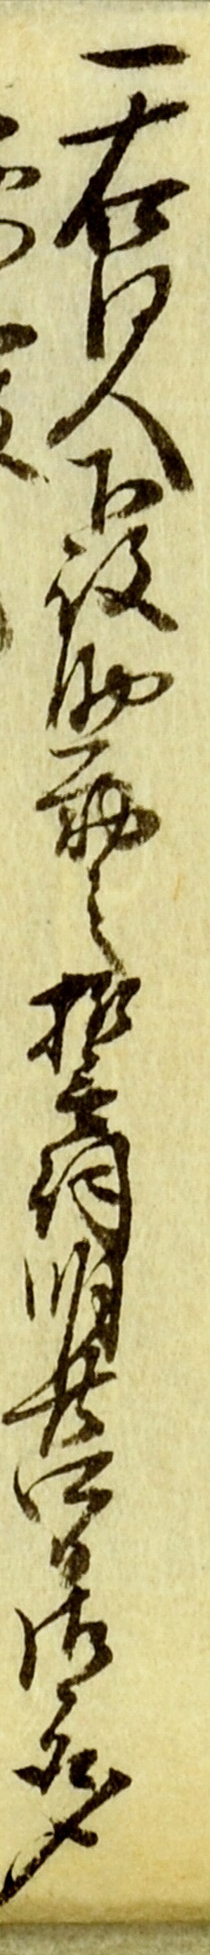一右同人下役助勤之誓詞明廿四日御取〆
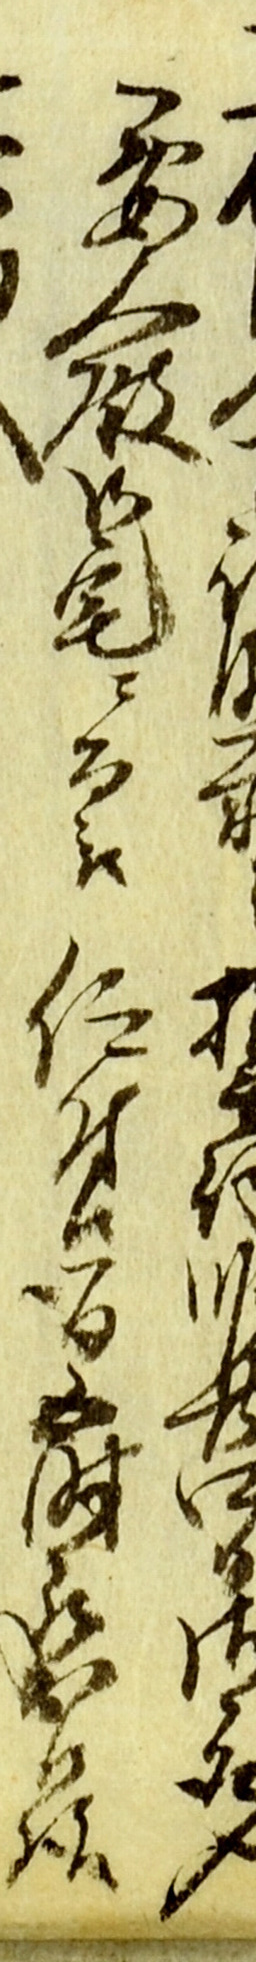要人殿御宅ニ而被仰付候間五時罷出候様
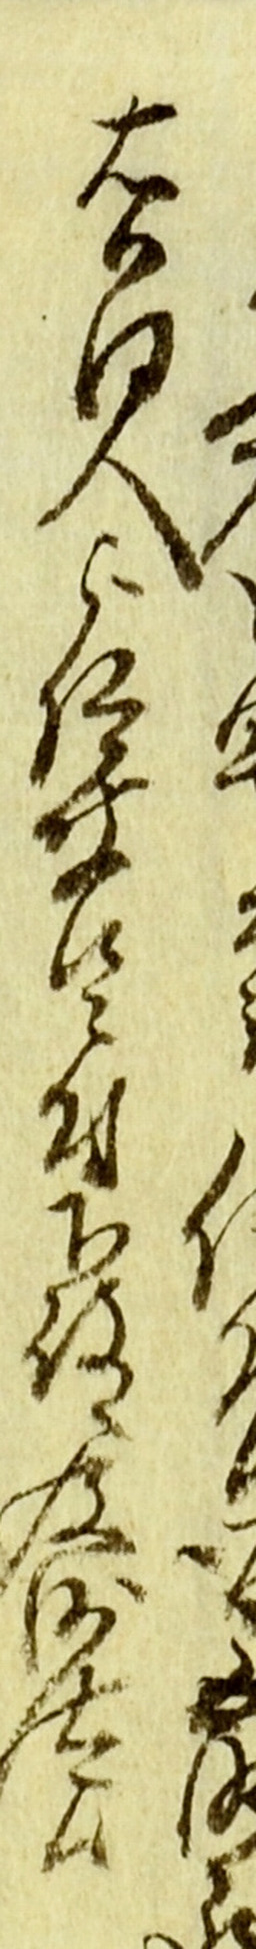右御同人被仰付候ニ付下役へ及沙汰候
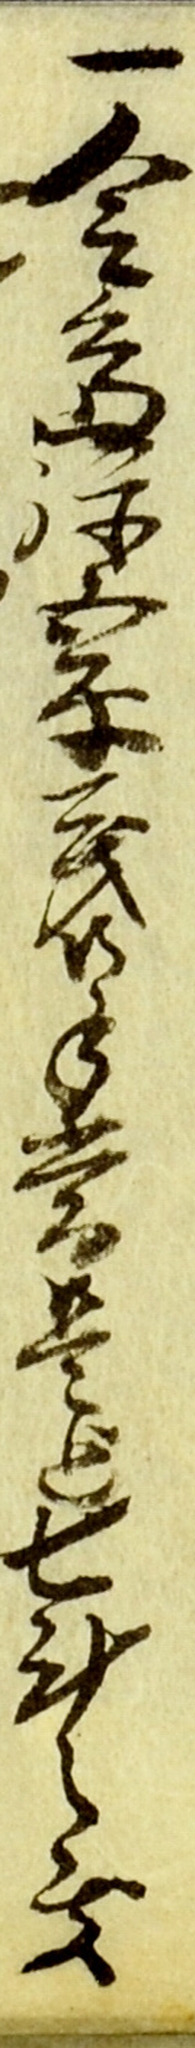一金島弥五平義御手当是迄七斗之処
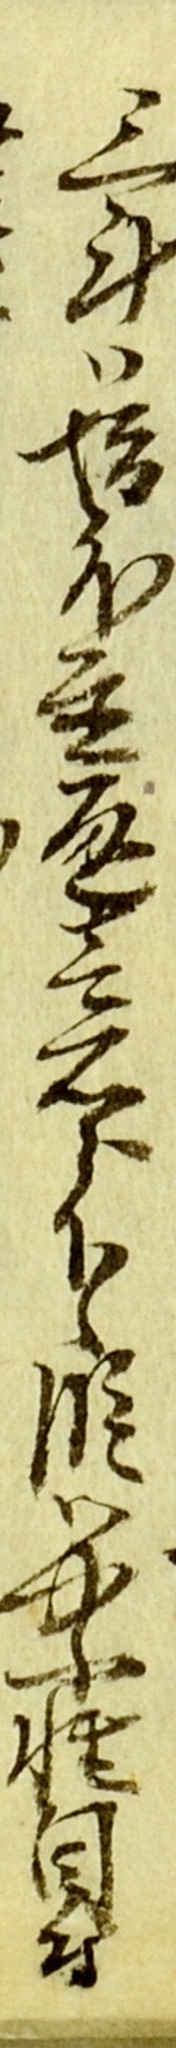三斗御増下置通壱石分下候段御中小性目付
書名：諸事御用留
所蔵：伊那市立高遠町図書館・合同会社AMANE
